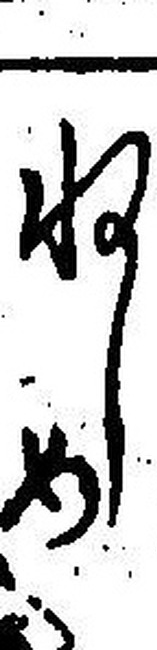ねしめ
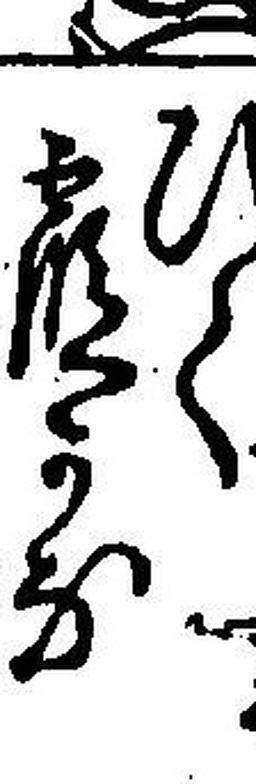霞かな
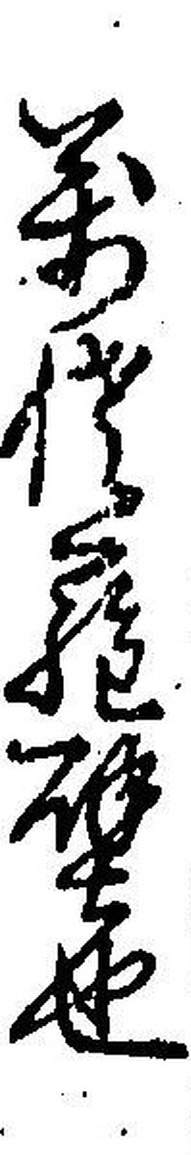万佐羅壁也
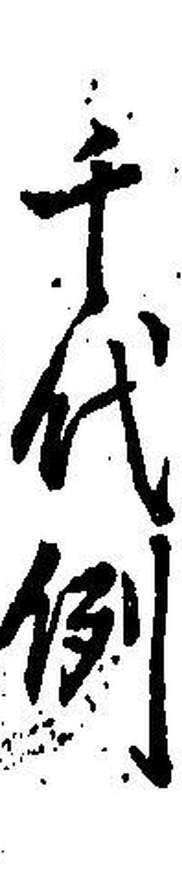千代例
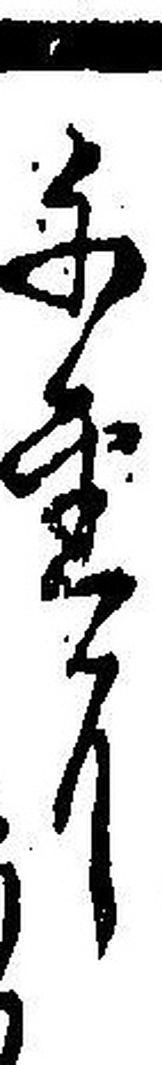千金に
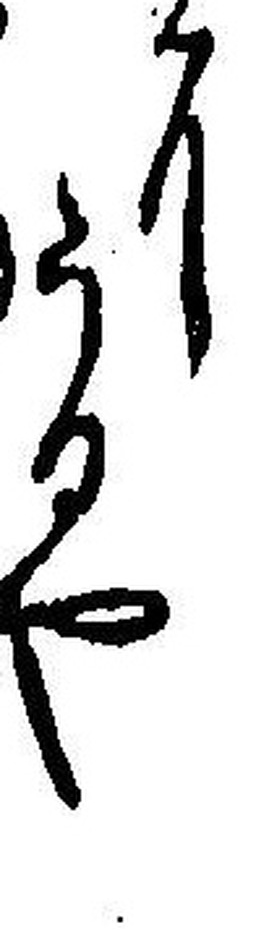うるや
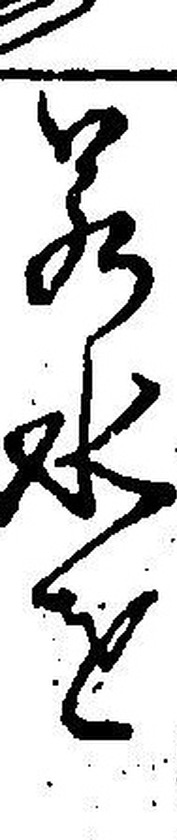若水を
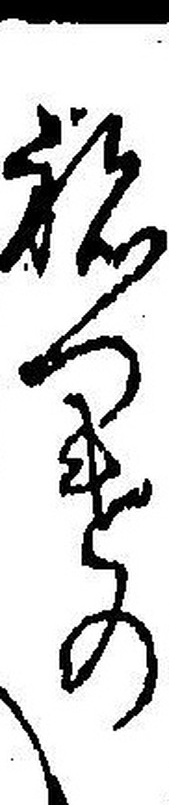ねつけの
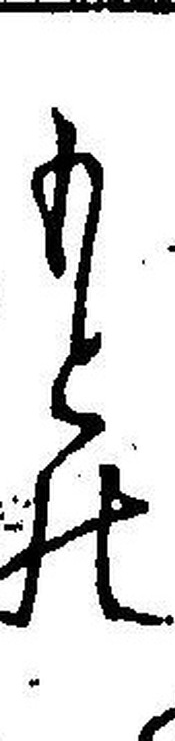もとの
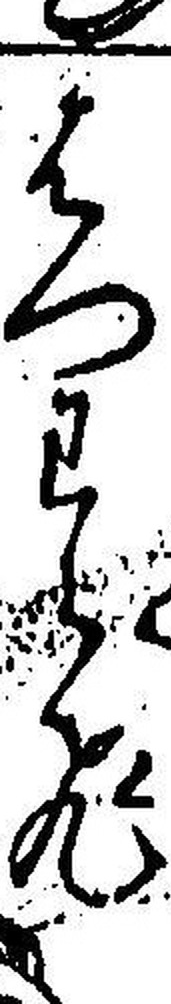はつわらひ
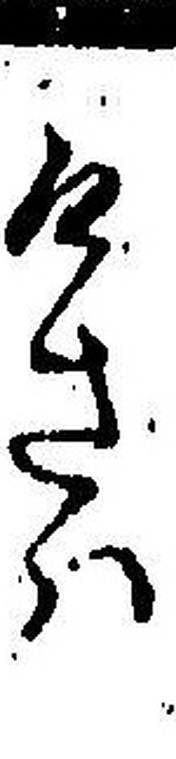けさは
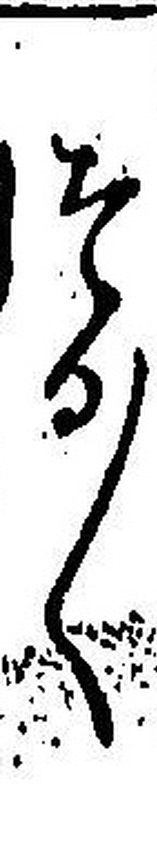つる〳〵
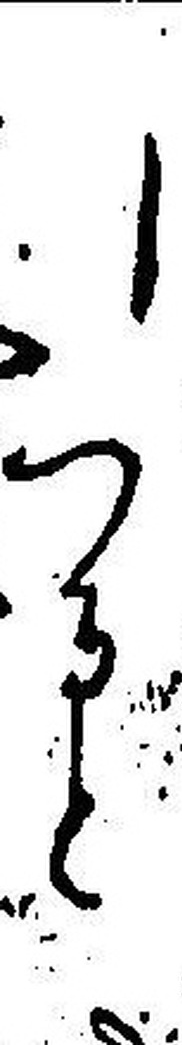つると
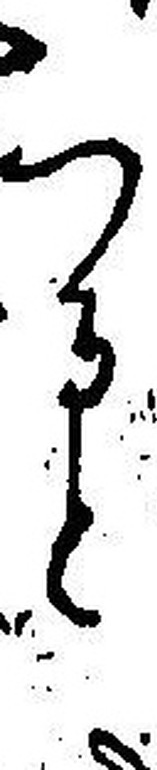つると
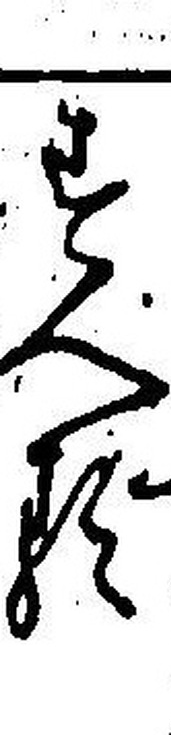すへる
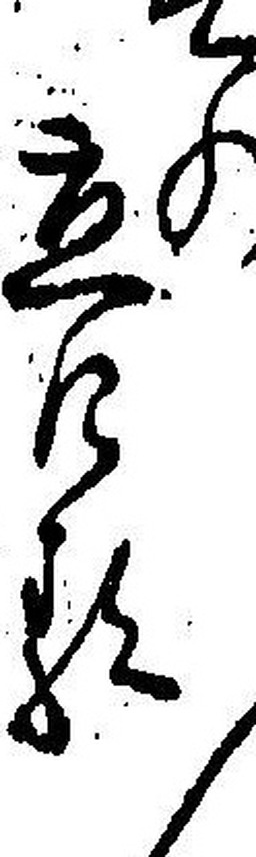立ける
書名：どうれ百人一首 / 鹿都部真顔(狂歌堂)編
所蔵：東京大学総合図書館 General Library in the University of Tokyo, JAPAN
